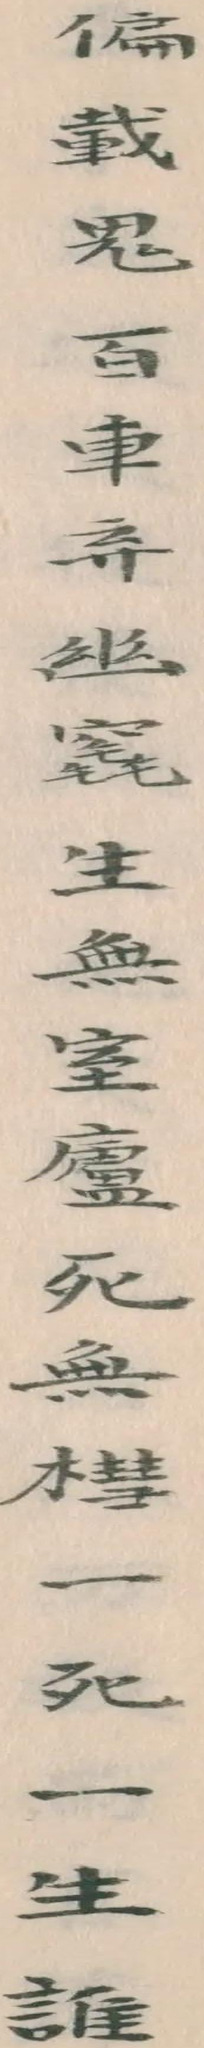偏載鬼百者弃幽竁生無室廬死無槥一死一生誰
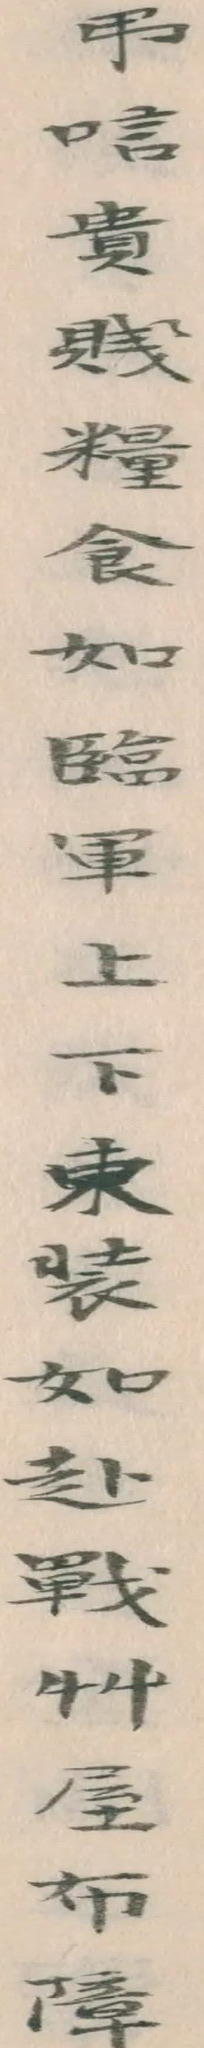弔唁貴賎糧食如臨軍上下東装如赴戰艸屋布障
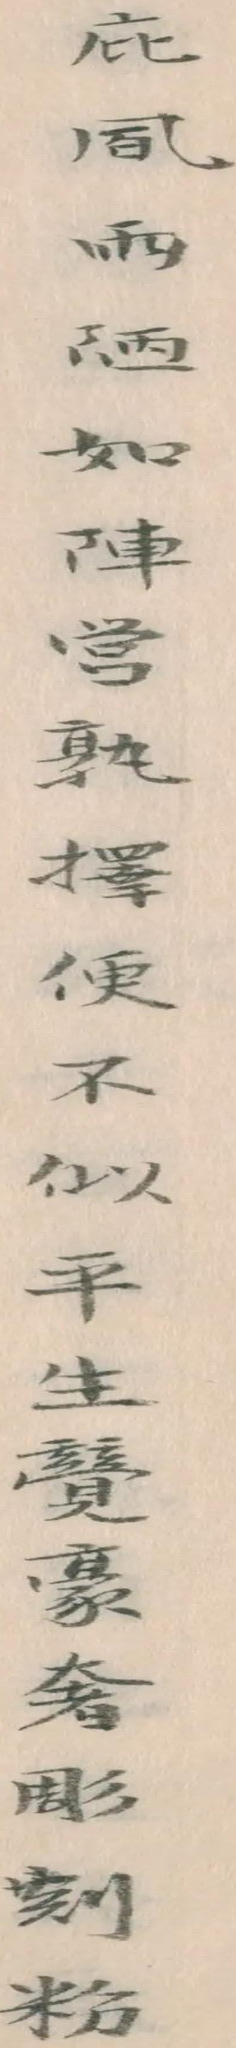庇凮雨陋如陣営孰擇便不似平生豪奢彫刻粉
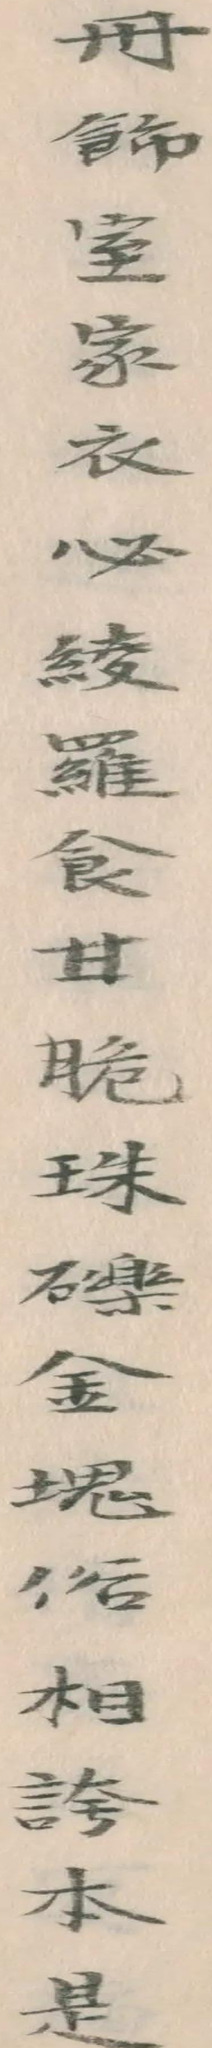丹飾室家衣必綾羅食甘脆珠礫金塊俗相誇本是
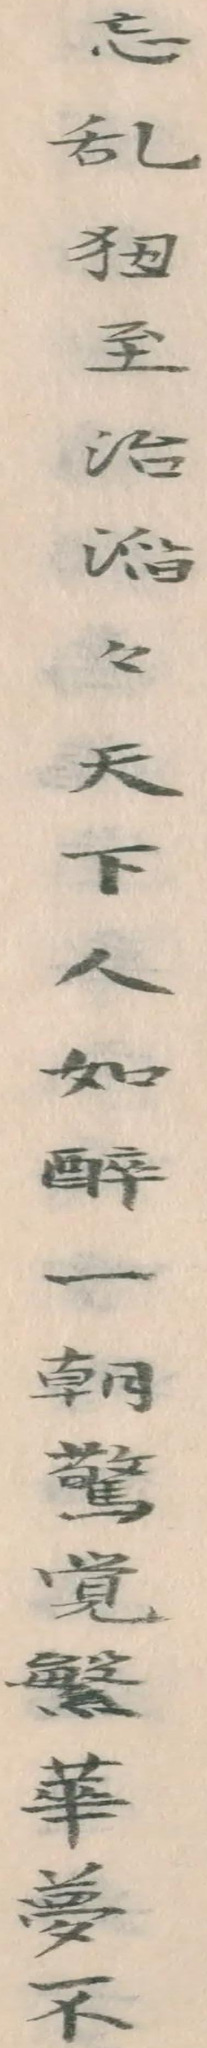忘乱狃至治㴞々天下人如醉一朝驚覚䌓蕐夢不
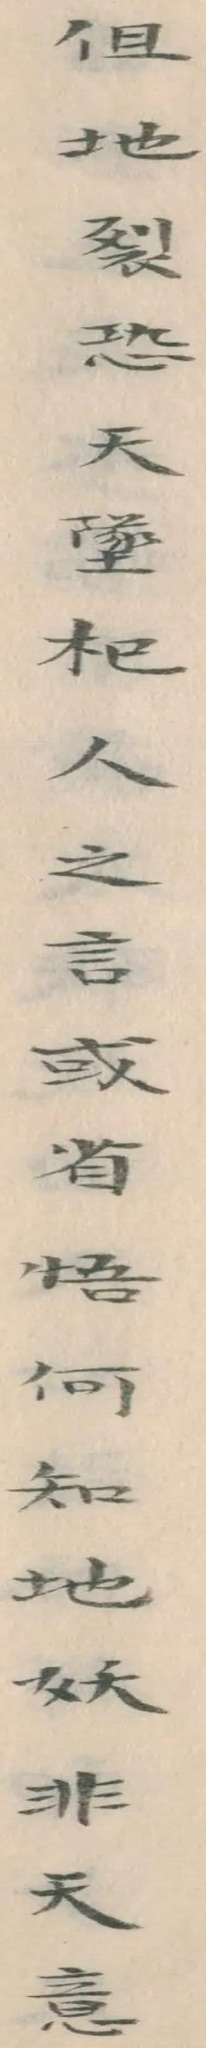但地裂恐天墜杞人之言或省悟何知地妖非天意

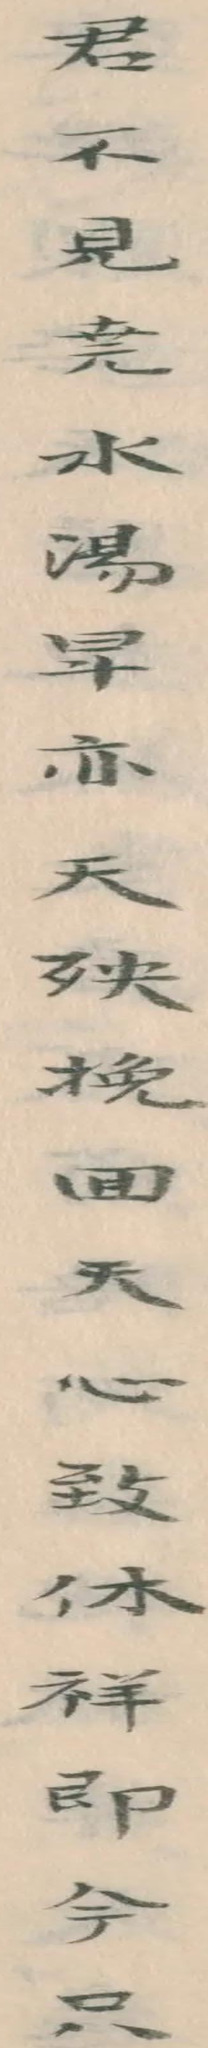君不見尭水湯昇亦天殃挽回天心致休祥即今只
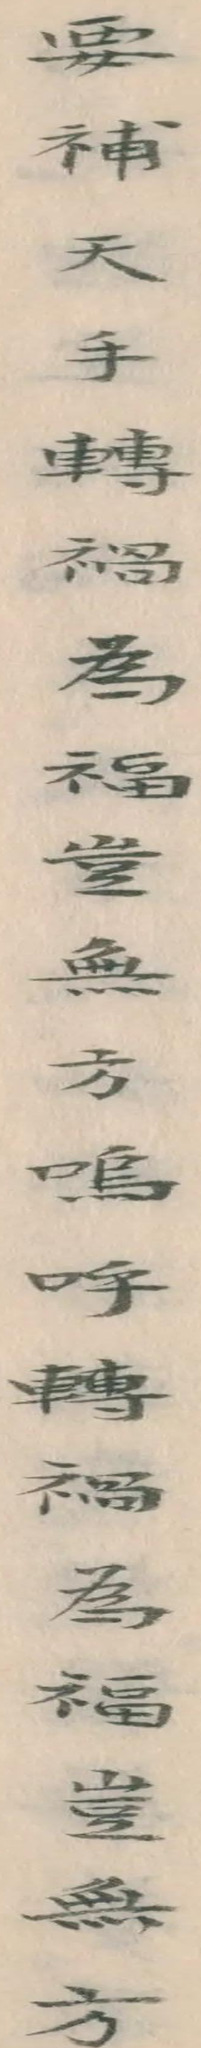要補天手轉禍為福豈無方嗚呼轉禍為福豈無方
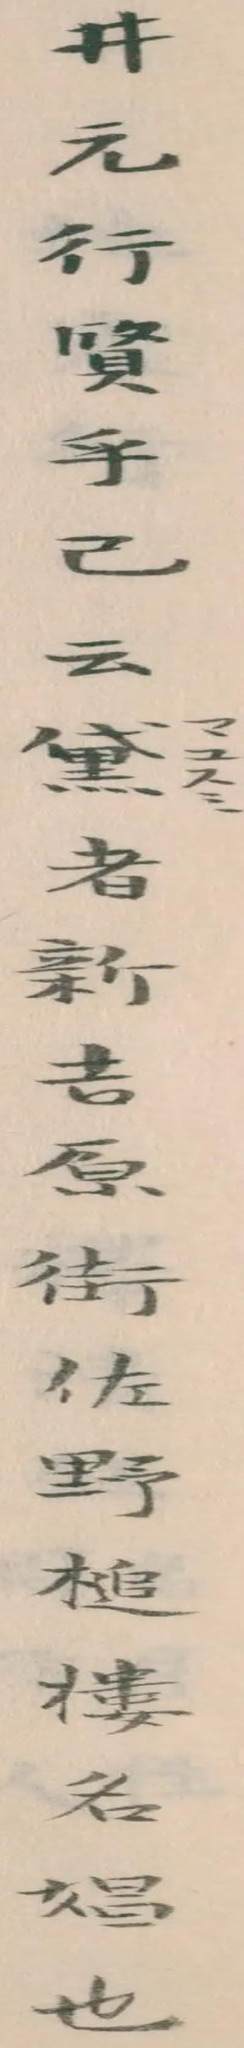井元行賢乎己云黛者新吉原街佐野槌樓名娼也
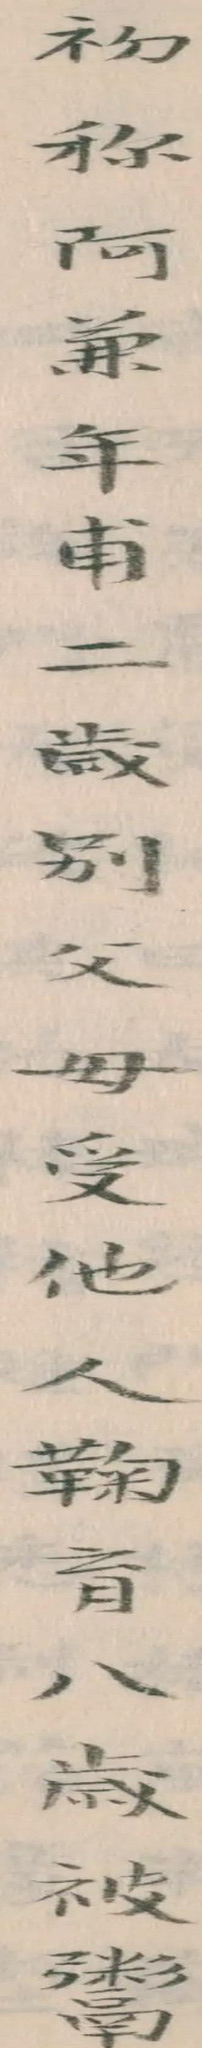初称阿兼年甫二歳別父母受他人鞠育八歳被鬻
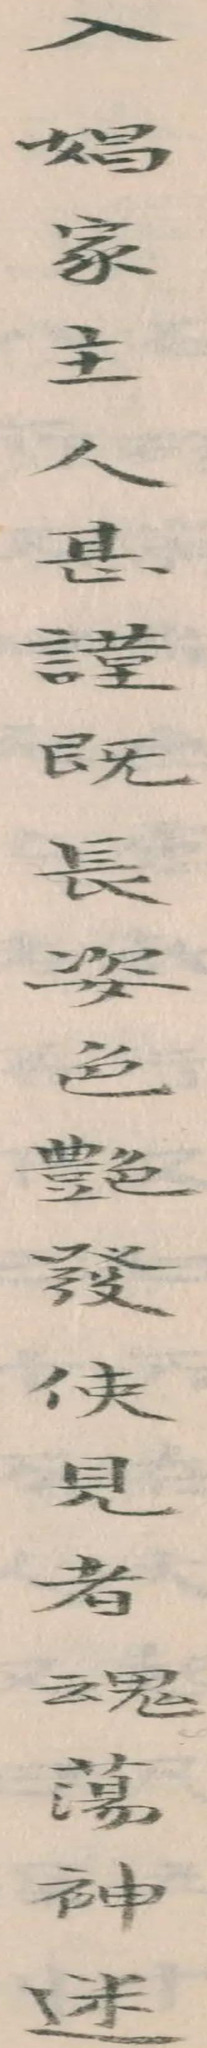入娼家主人甚謹既長姿色艶發使見者魂蕩神迷
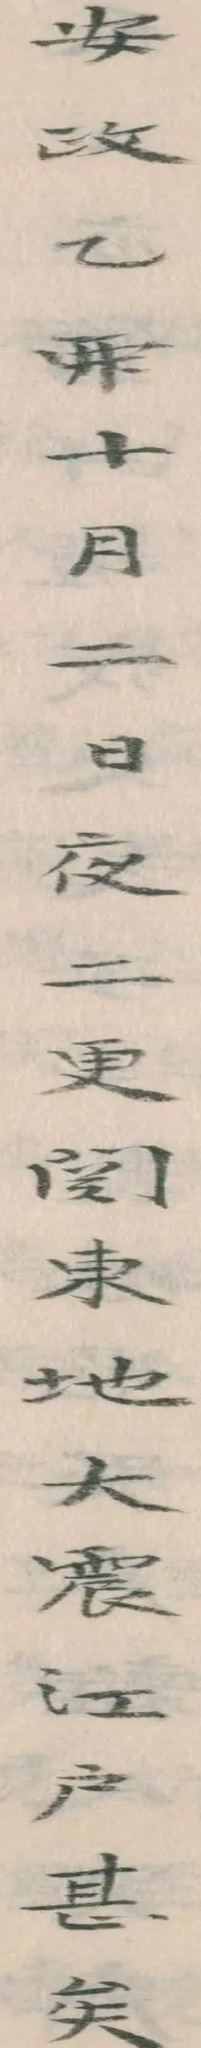安政乙卯十月二日夜二更関東地大震江戸甚矣
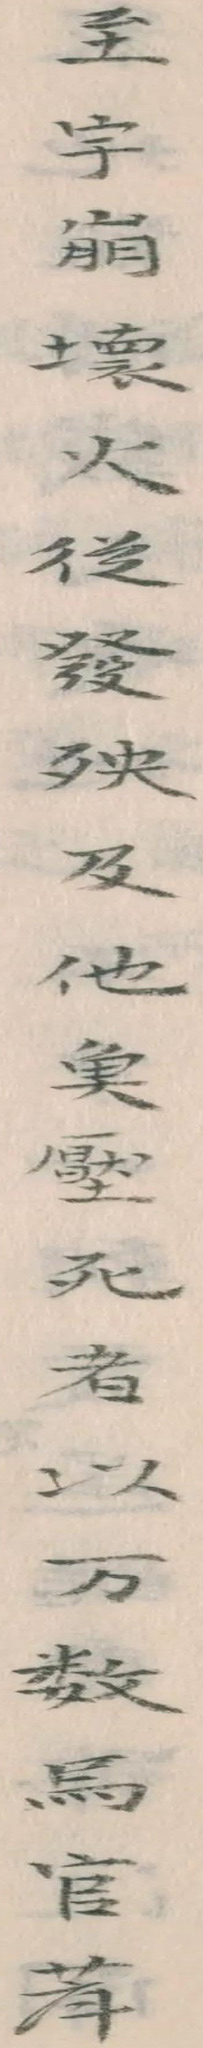至宇崩壊火後發殃及他魚壓死者以万数烏官
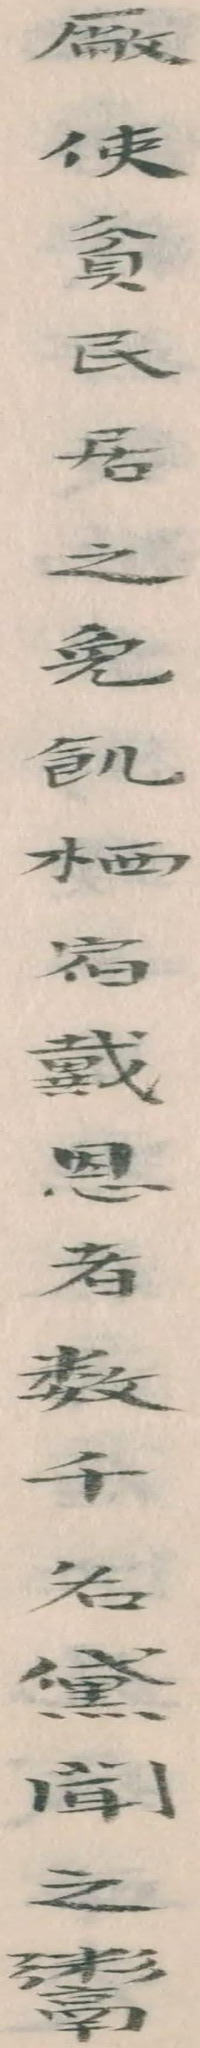厰使貧民居之免飢栖宿戴恩者数千名黛聞之鬻
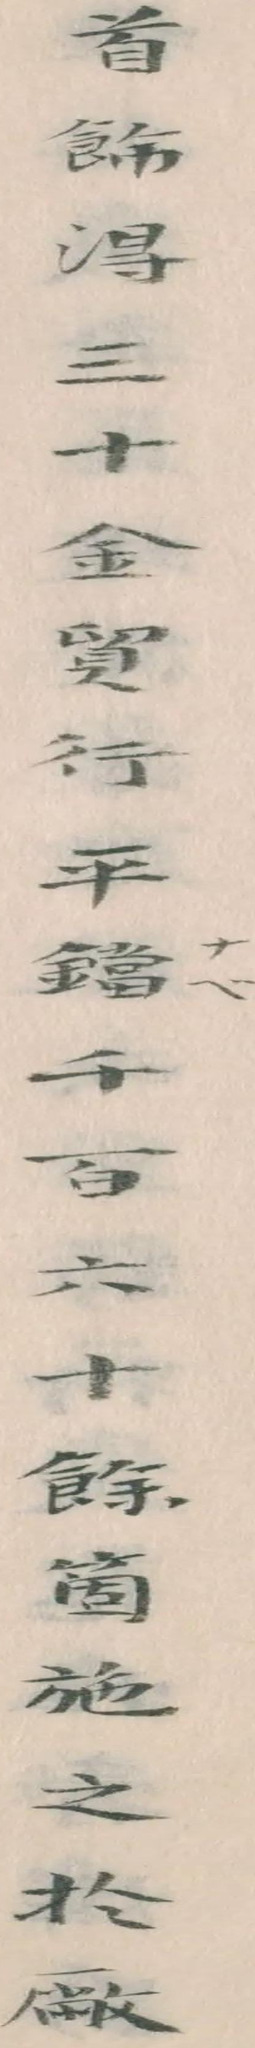首飾淂三十金貿行平鐺千百六十餘箇施之扵厰
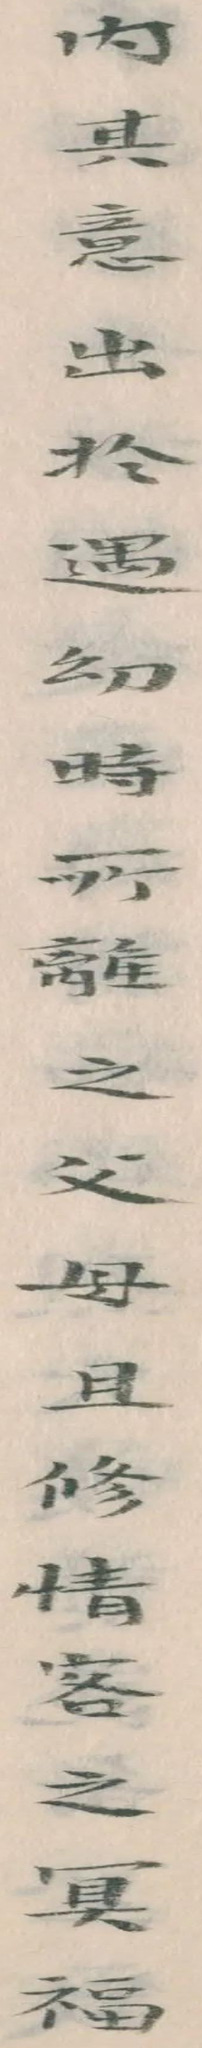内其意出扵遇幼時所離之父母且修情客之冥福
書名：地災撮要. 巻11-12(地震之部)
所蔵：国立国会図書館 National Diet Library, JAPAN
